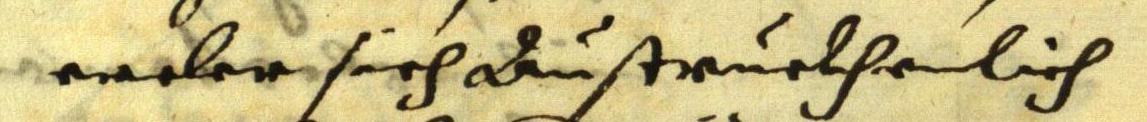ercler sich Aūstrūckhenlich
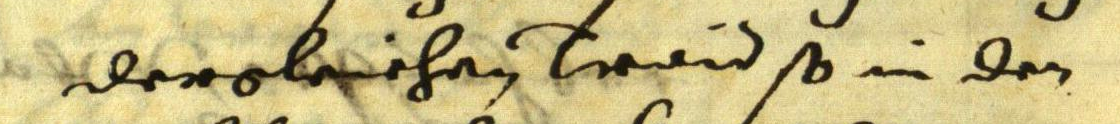dergleichen Traid so in der
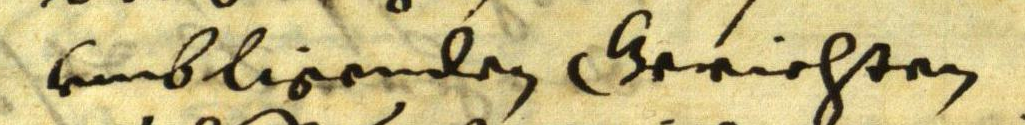vmbligenden Gerichten
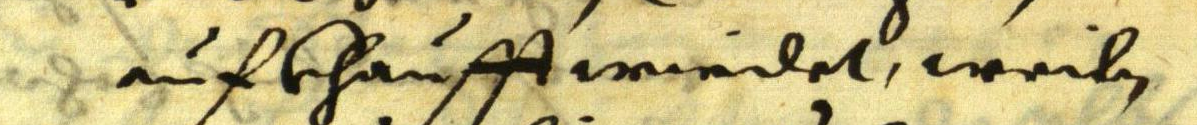aūfkhaūfft wirdet, weiln
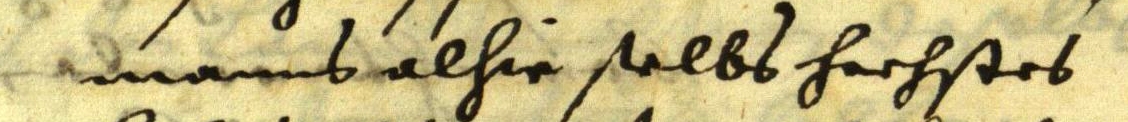manns alhie selbs hechstes
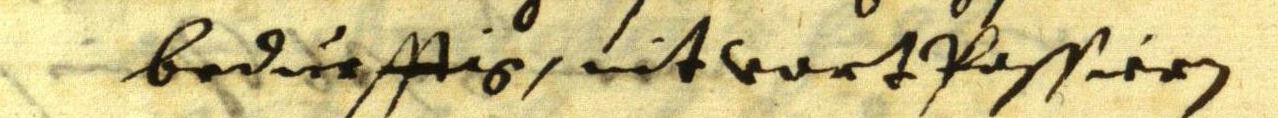bedūrfftig, nit vortPassiern
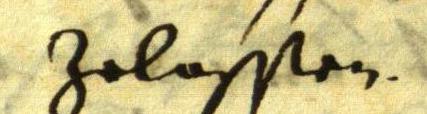Zelassen.
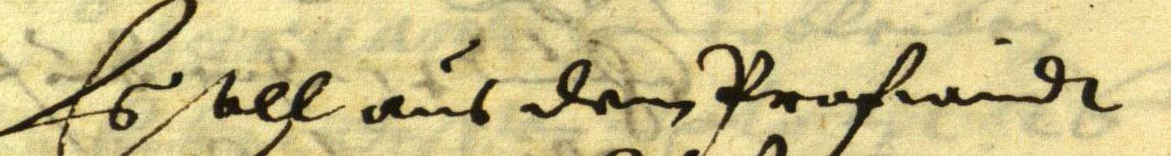Es soll aūs dem Profiandt
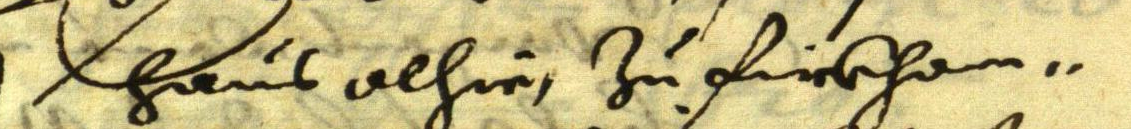haūs alhie, Zū firkhom¬
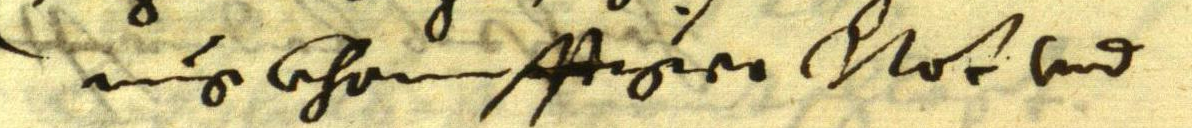ūng khonnfftiger Not vnd
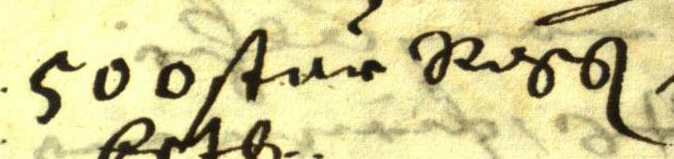500 stār Rogg
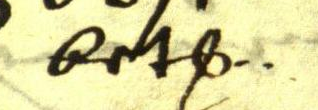bet:
